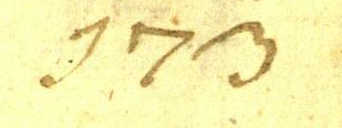173
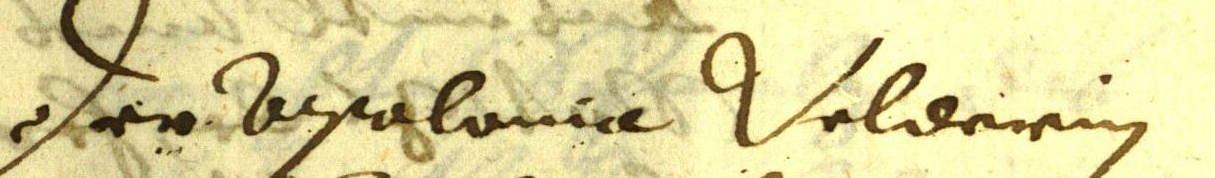Der Apolonia Velderin
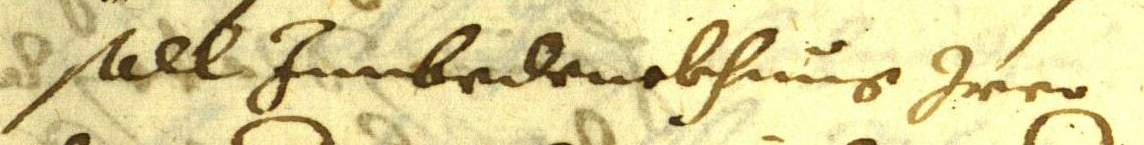soll Innbedenckhūng Irer
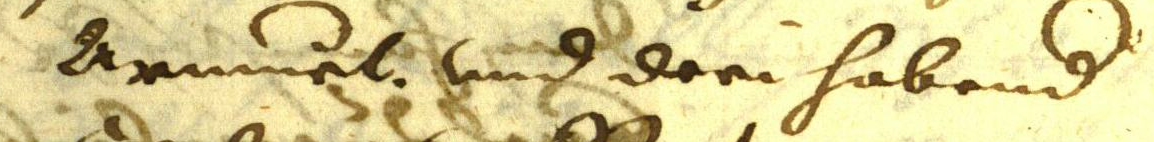Armūet. vnd drei habend
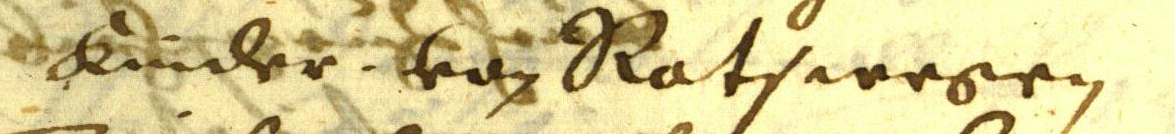Kinder. von Ratswegen
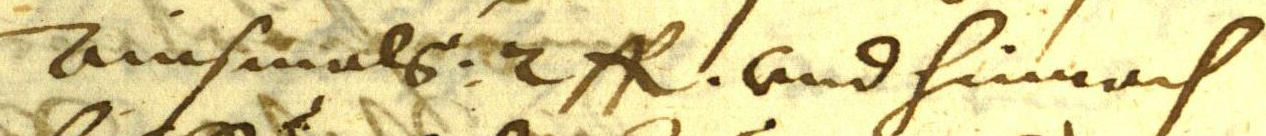Ainsmals: 2 fl. vnd hinnach
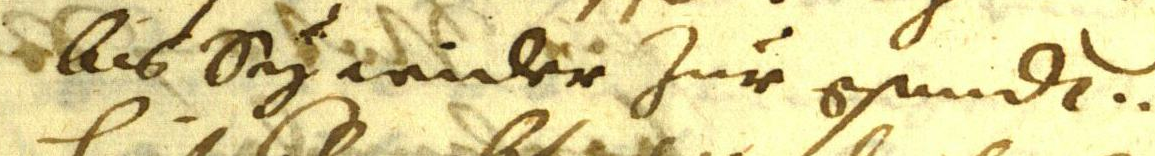bis Sȳ wider Zūr gsūndt¬
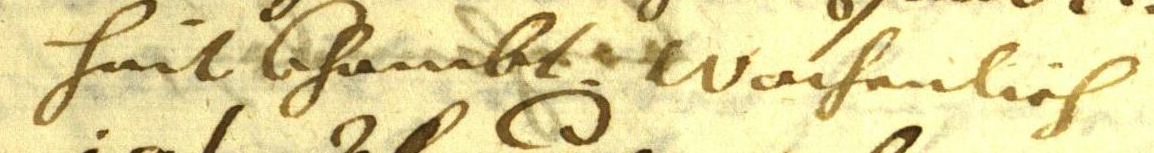hait khombt. wochenlich
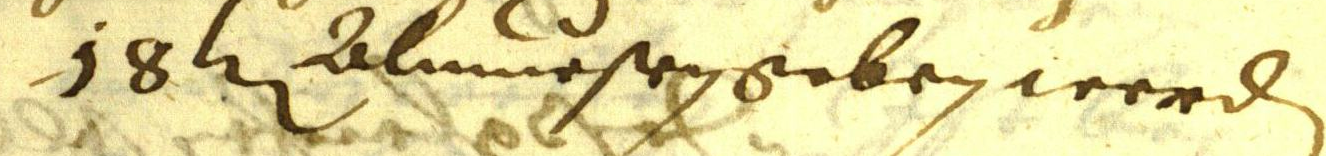18 k Almūesen geben werd.
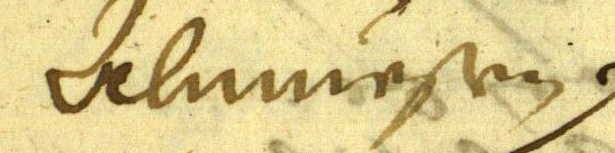Almūesen
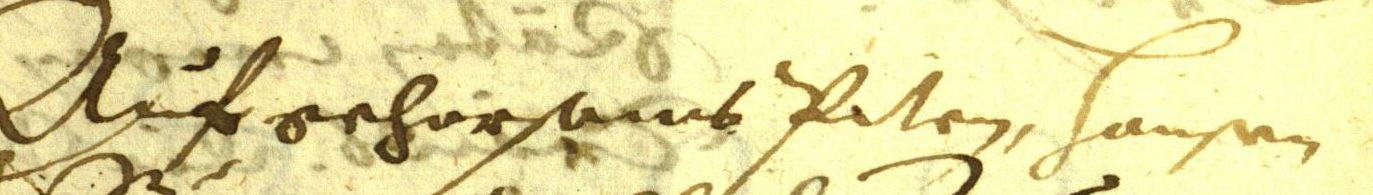Aūf gehorsams Piten, hansen
